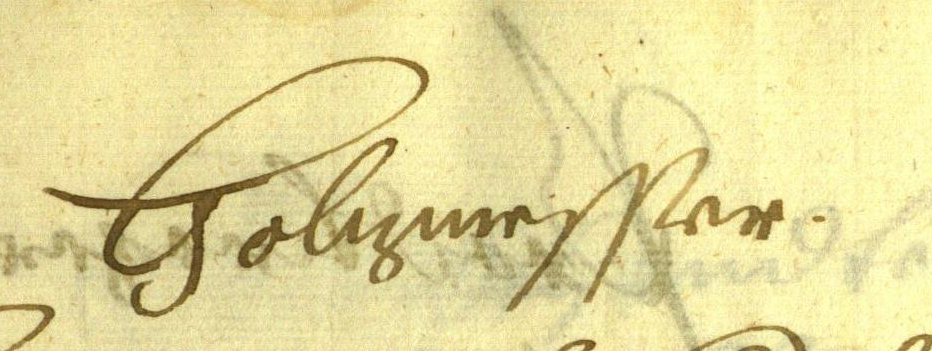Holzmesser.
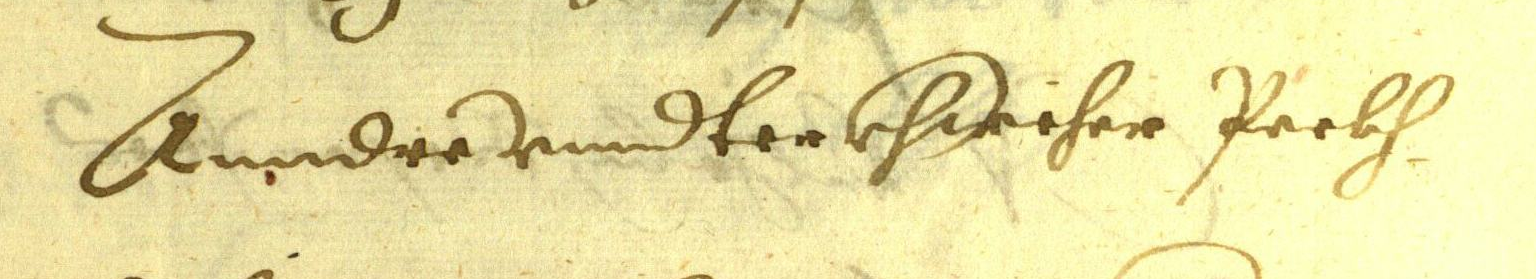Anndre Vndter Khircher Peckh.
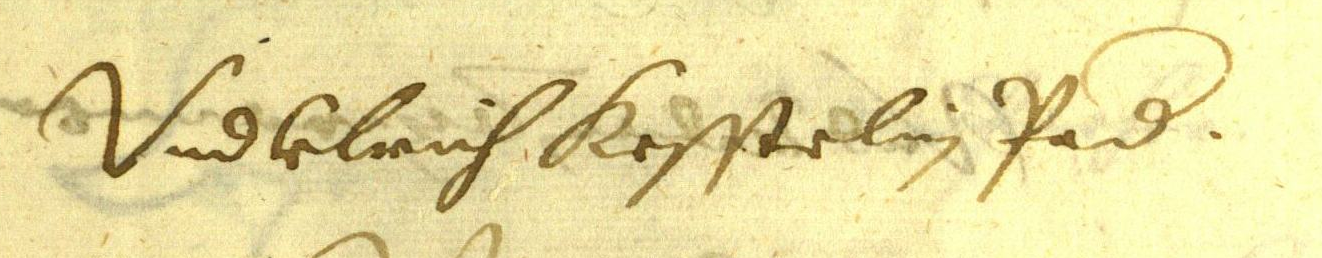Vnd Vlrich Kesstelin Pad.
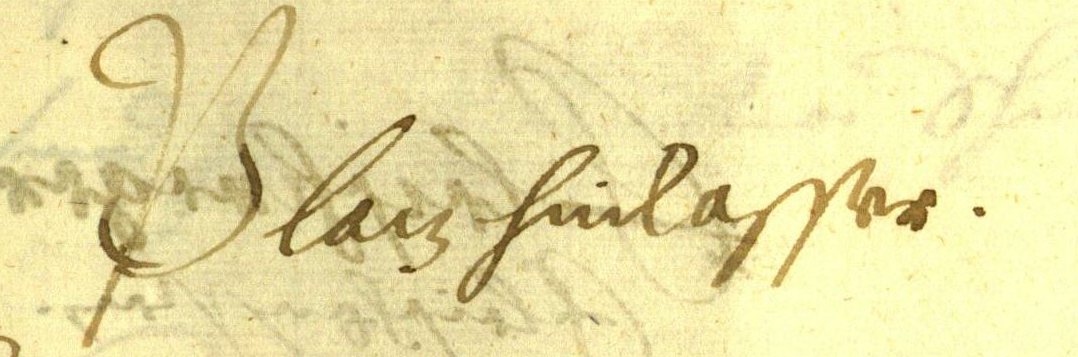Plaz hinlasser.
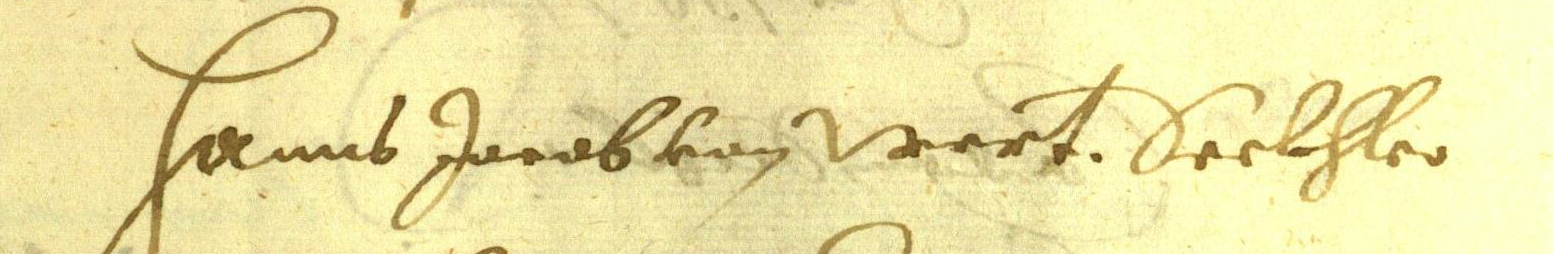hanns Jacob von Wert. Seckhler
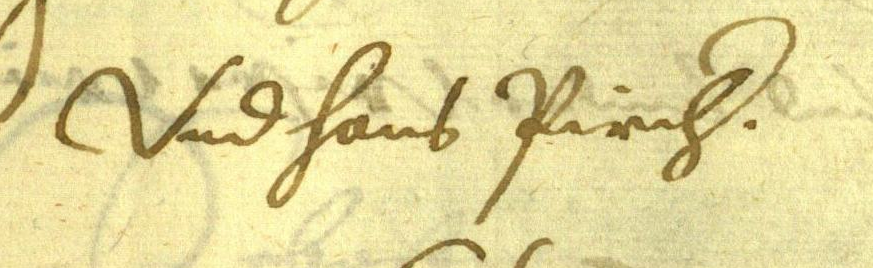Vnd hans Pirch.
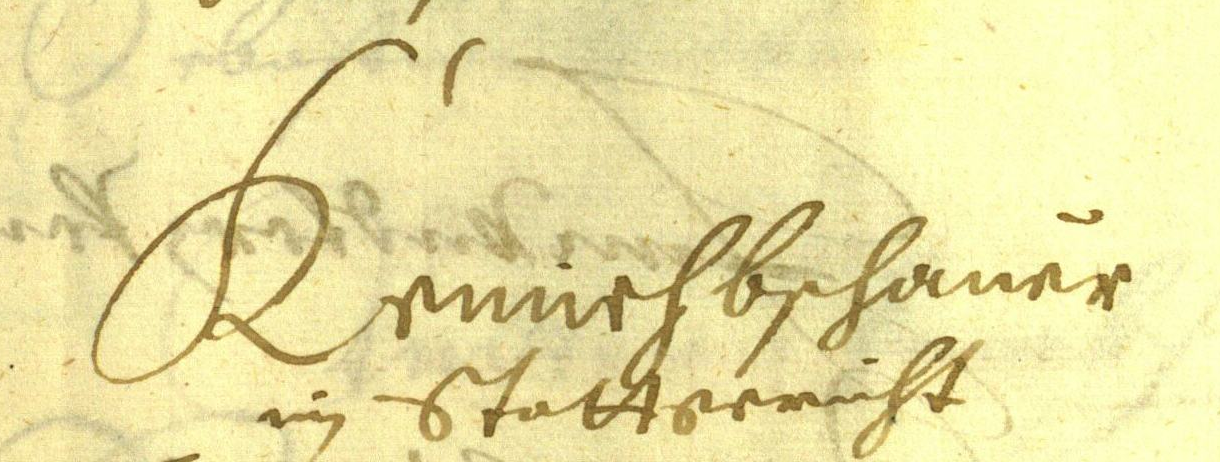Kēmichbschaūer
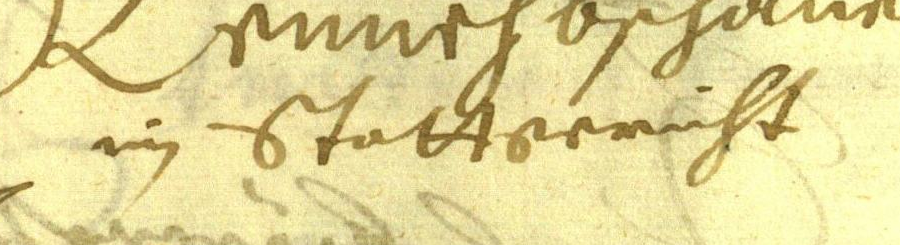im Stattgericht
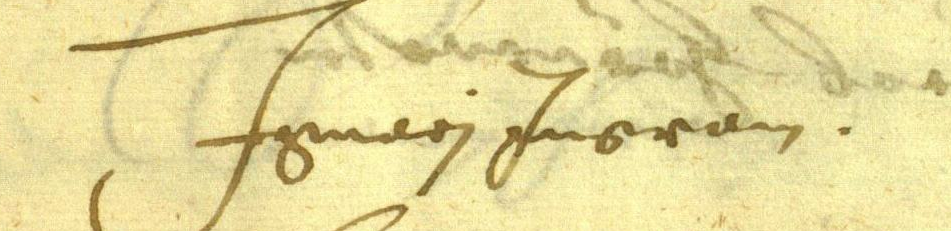Ignacien Ingram.
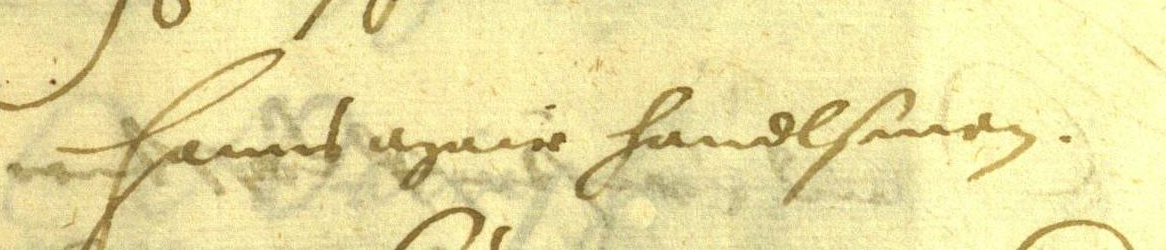hanns Mair handlsman.
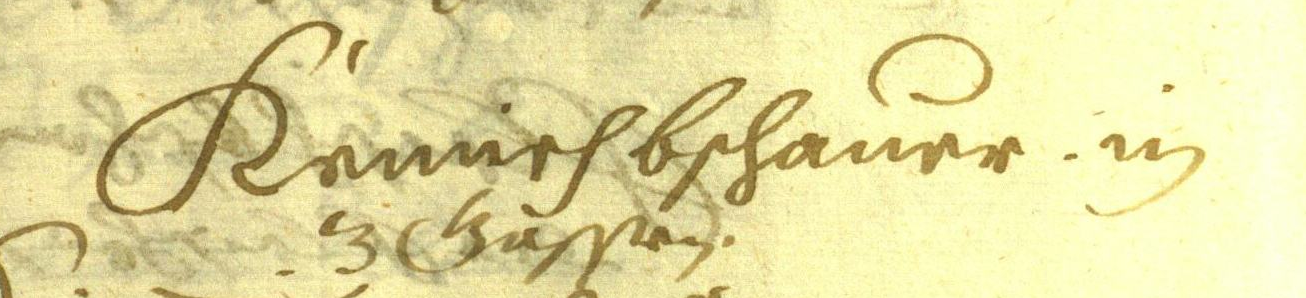Kēmichbschaūer. in
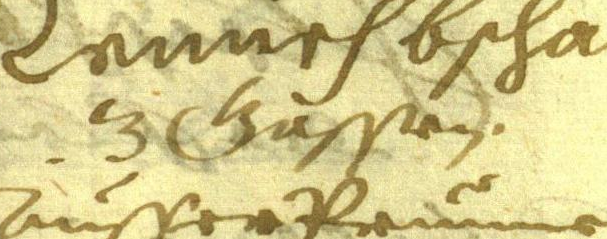3 Gassen.
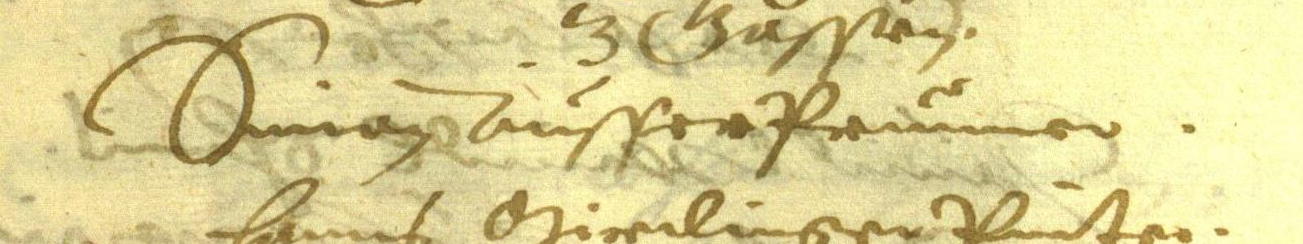Simon AūsserPrūnner.
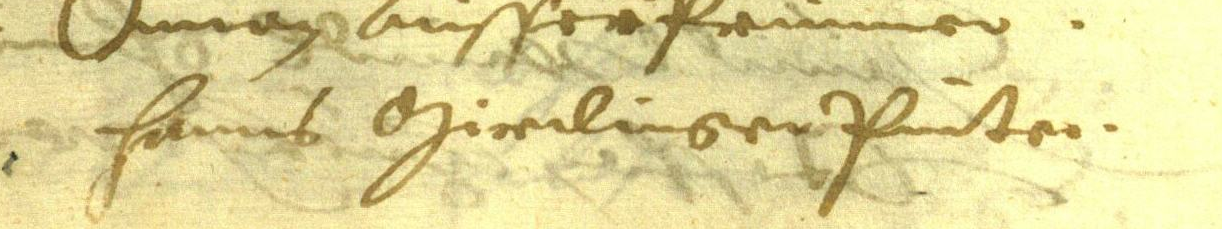hanns Mirdinger Pinter.
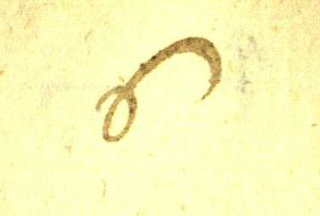6
